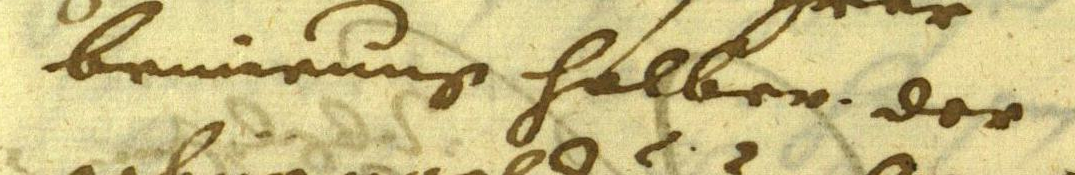bemieūng halber. der
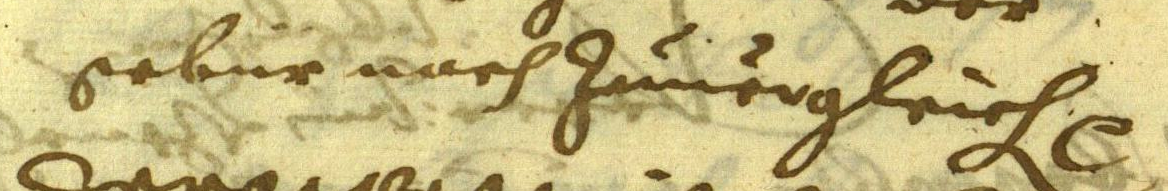gebür nach Zūūergleich etc.
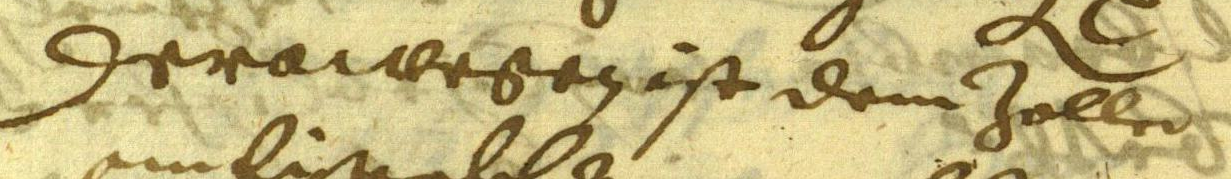Derowegen ist dem Zoller
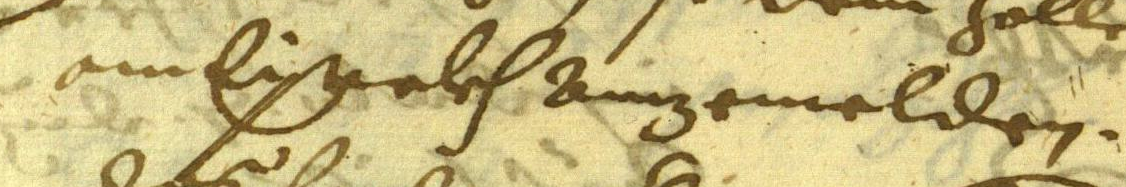am Eisackh Anzemelden.
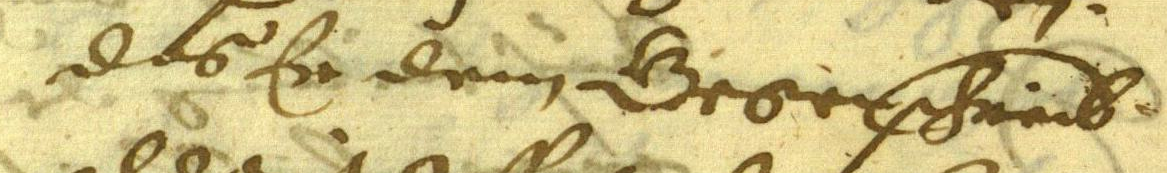das Er dem Gegenschreib
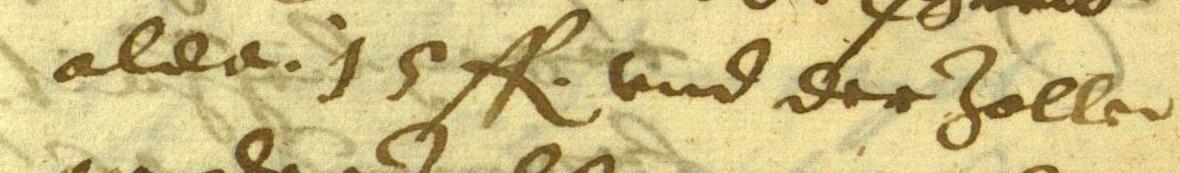alda. 15 fl. vnd der Zoller
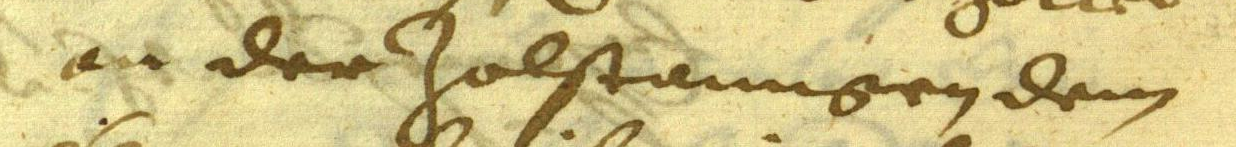an der Zolstanngen dem
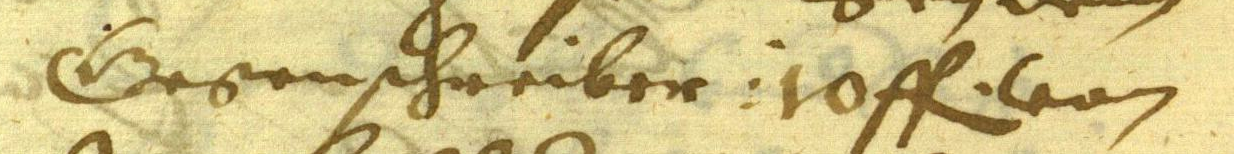Gegenschreiber: 10 fl. von
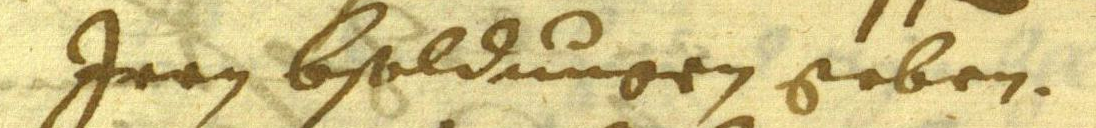Iren bsoldūngen geben.
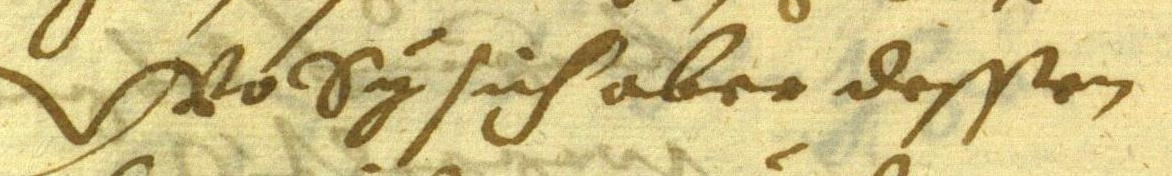Wo Sȳ sich aber dessen
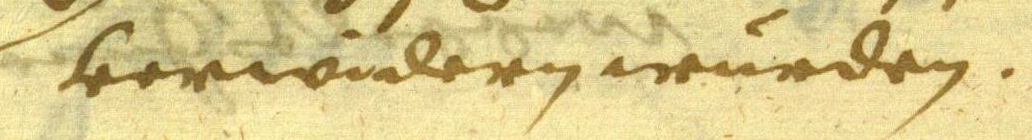verwidern wūrden.
